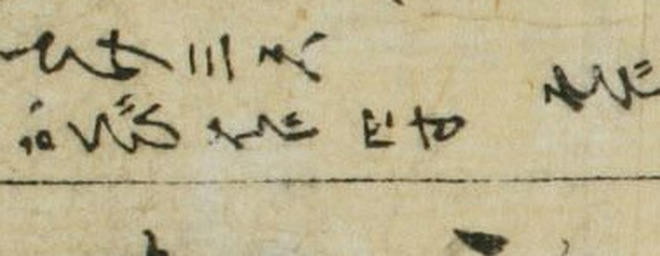おくびはゞ四寸
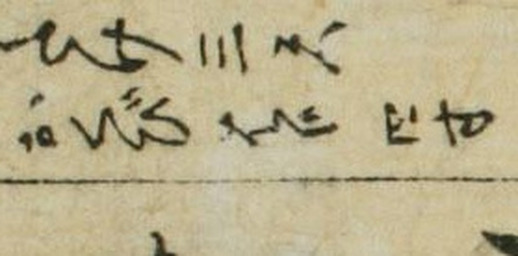おくびはゞ四寸

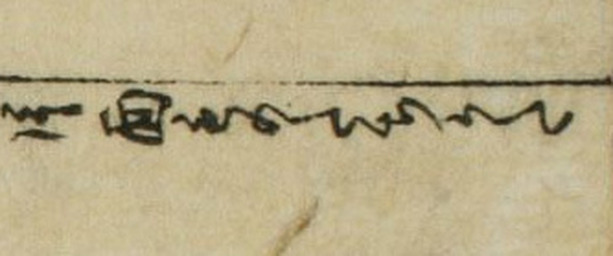片面ものたちかた
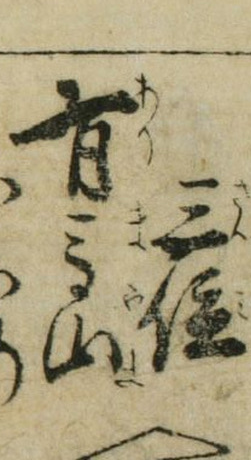有馬山
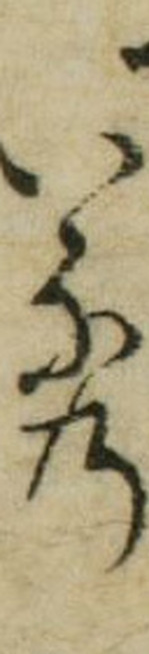いなの
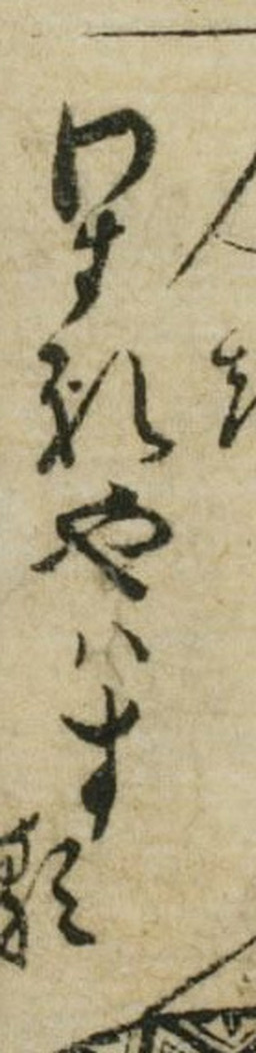わすれやはす
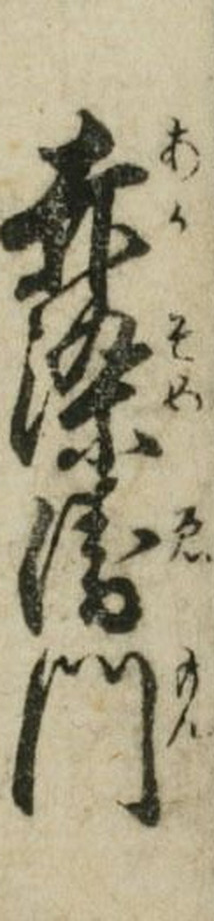赤染衛門
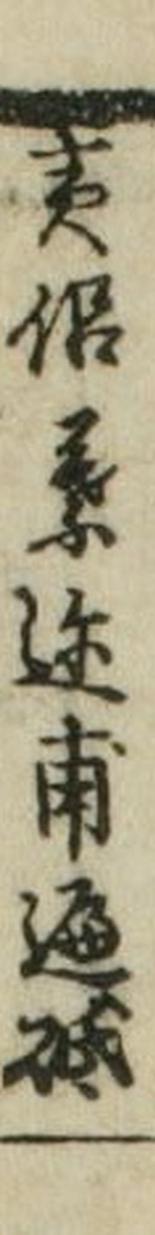夷侶葉迩甫遍砥
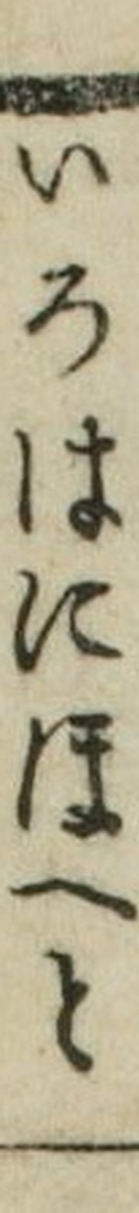いろはにほへと
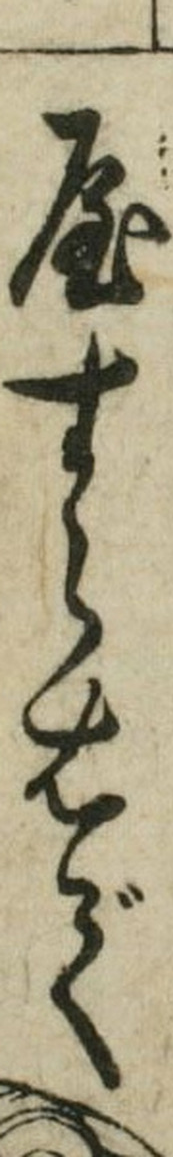やすらはで
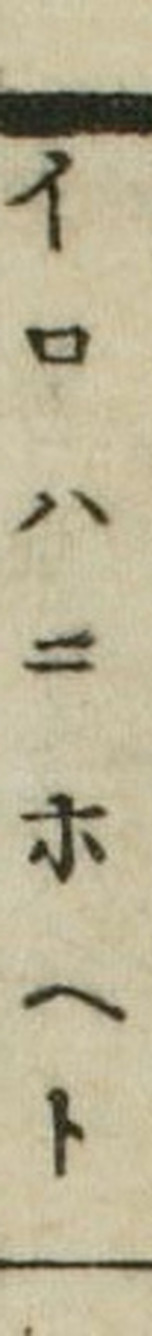イロハニホヘト
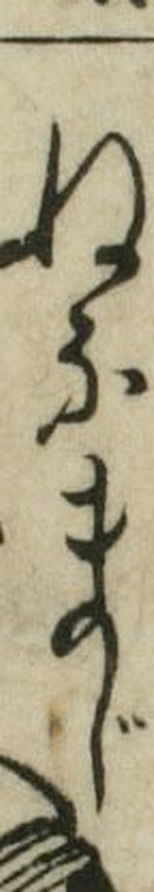ねなまじ
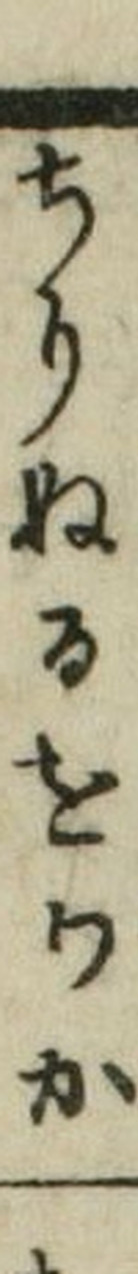ちりぬるをわか
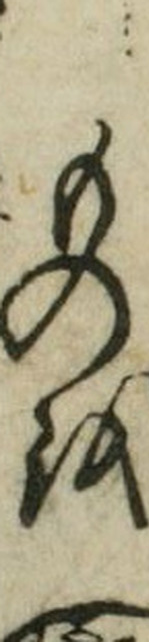ものを
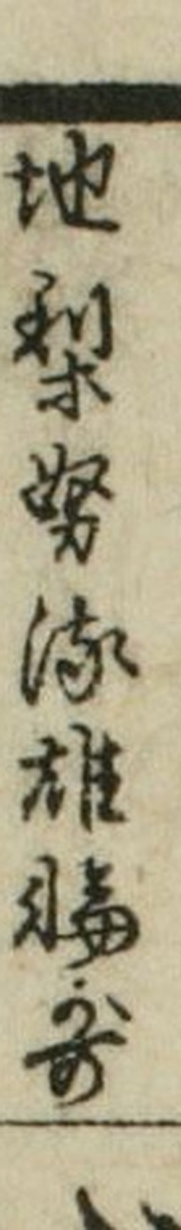地梨努流雄輪哥
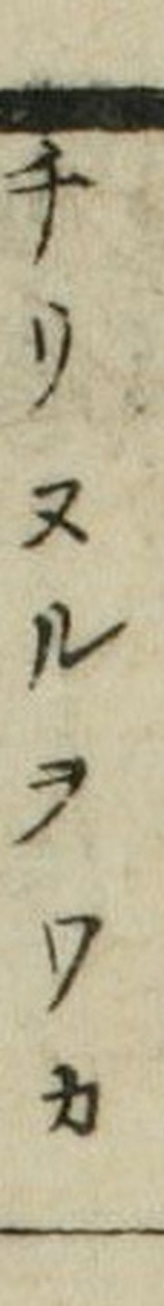チリヌルヲワカ
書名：百人一首
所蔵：東京学芸大学教育コンテンツアーカイブ
